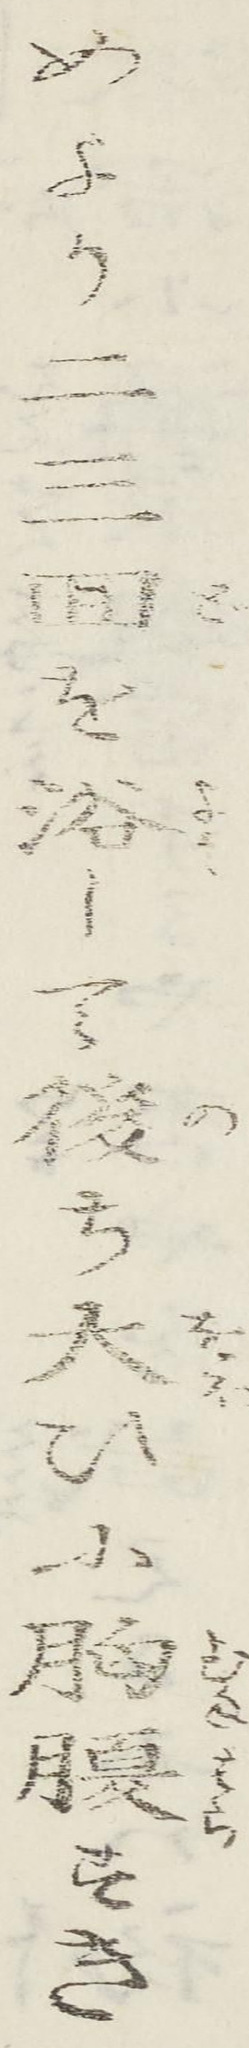めより二三回を浴して後ち大ひに胸腹すき
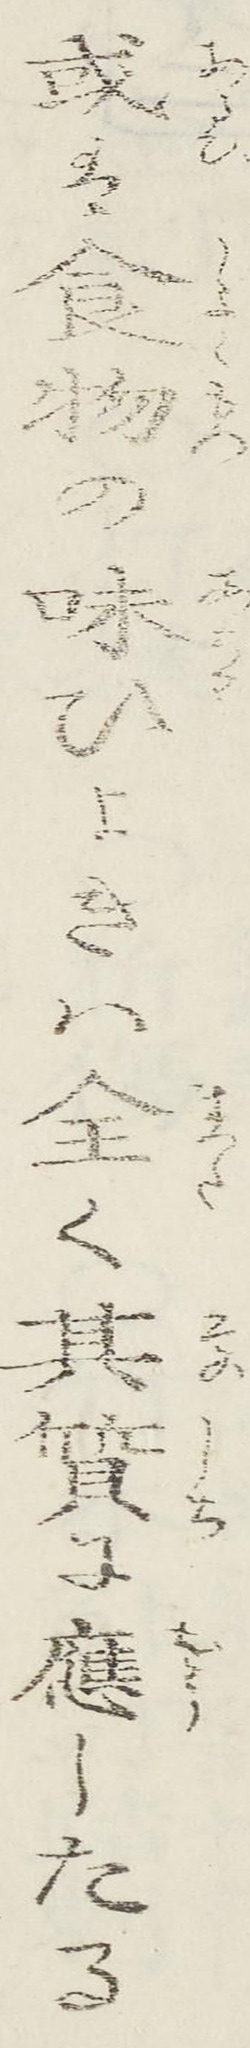或は食物の味ひよきは全く其質に応したる
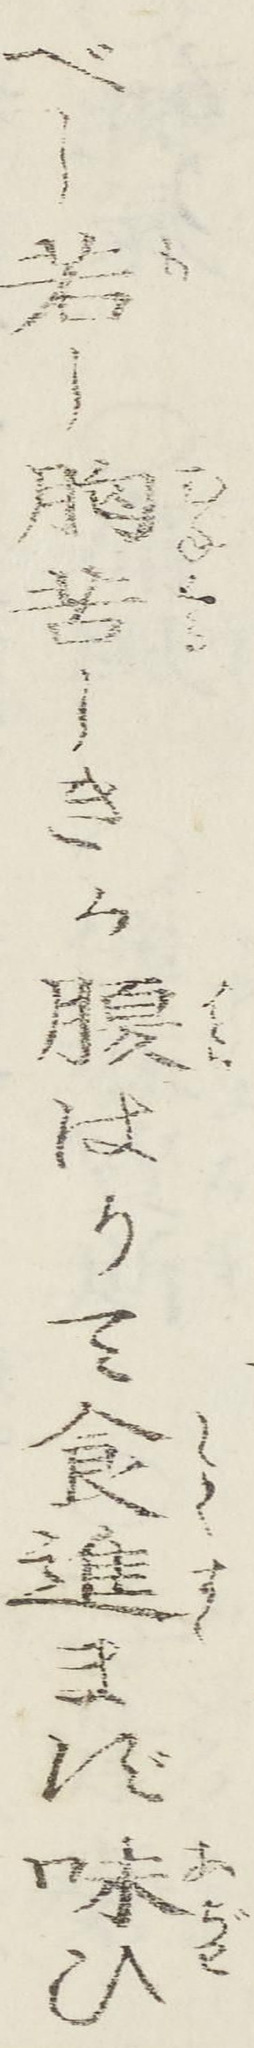べし若し胸苦しきか腹はりて食進まず味ひ
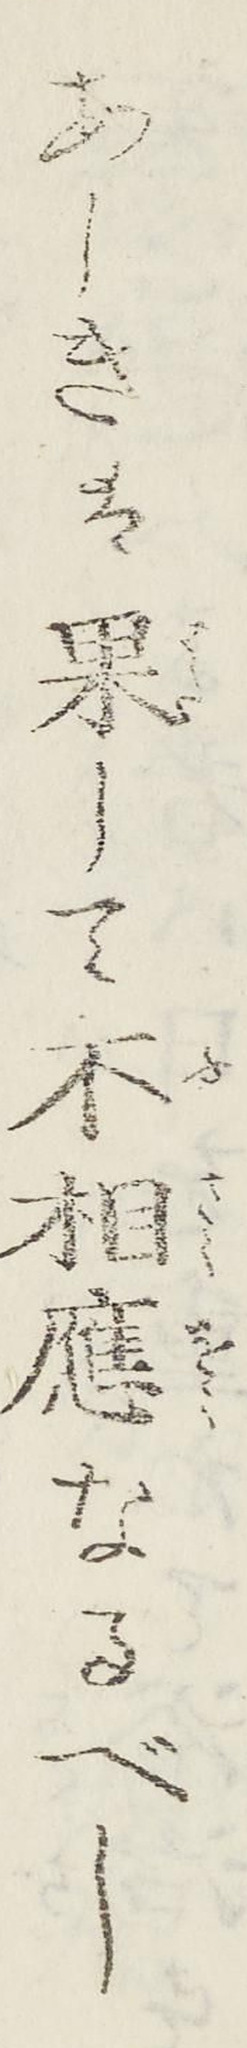あしきは果して不相応なるべし
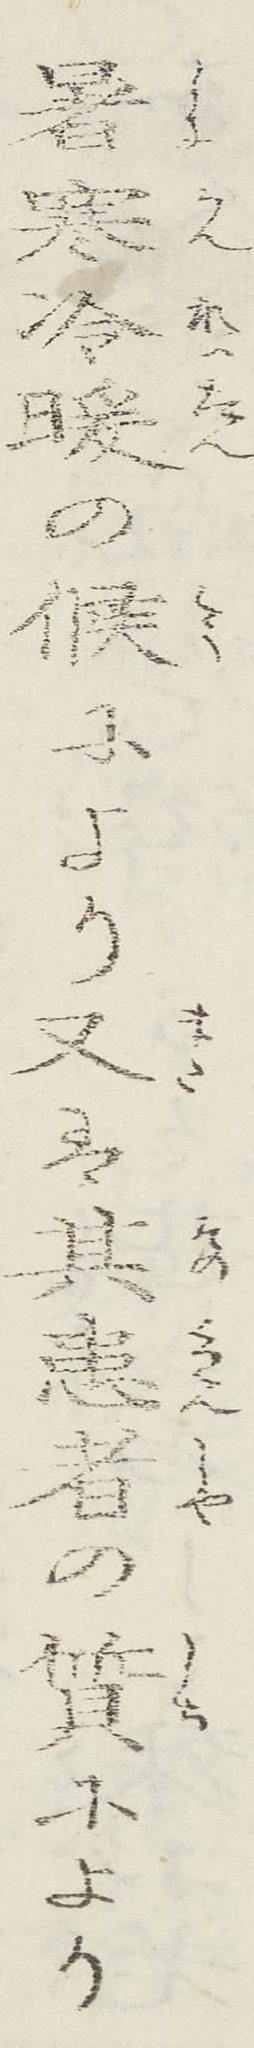暑寒冷暖の候により又は其患者の質により
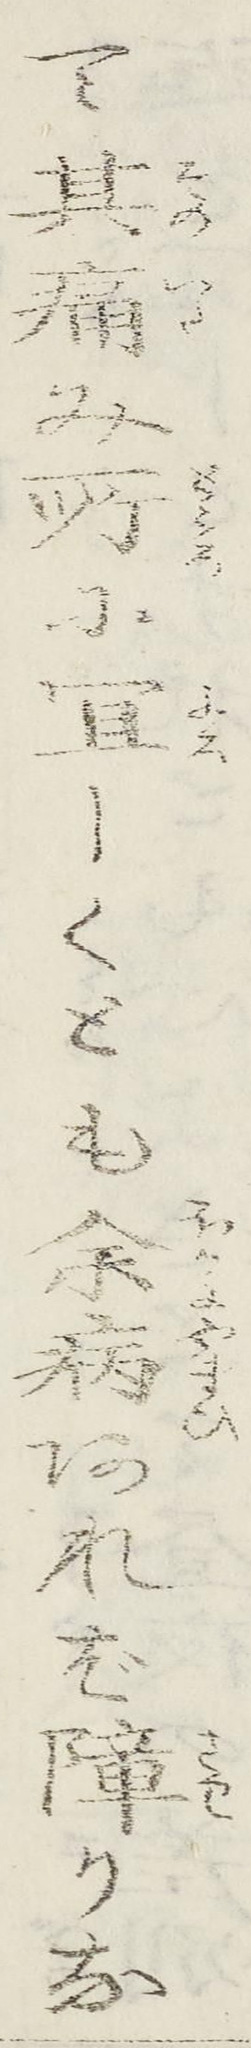て其痛み所に宜しくとも余病あれば障りな
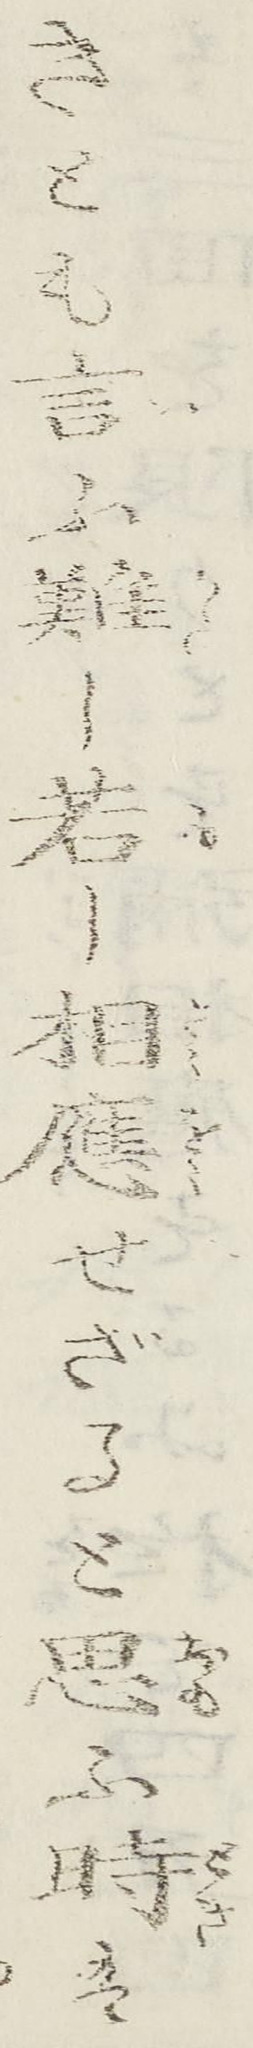きとも言ふ難し若し相応せざると思ふ時は
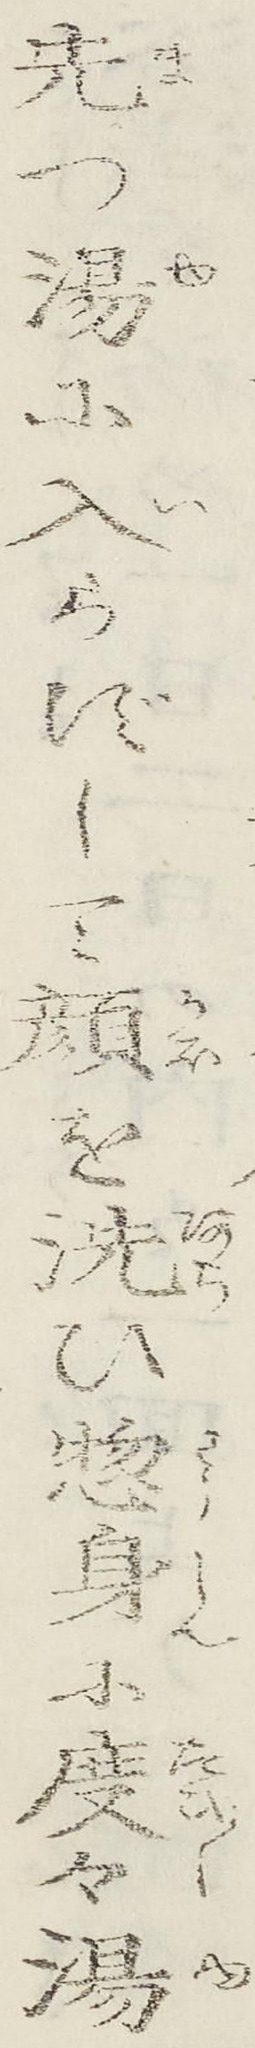先つ湯に入らずして顔を洗ひ惣身に度々湯
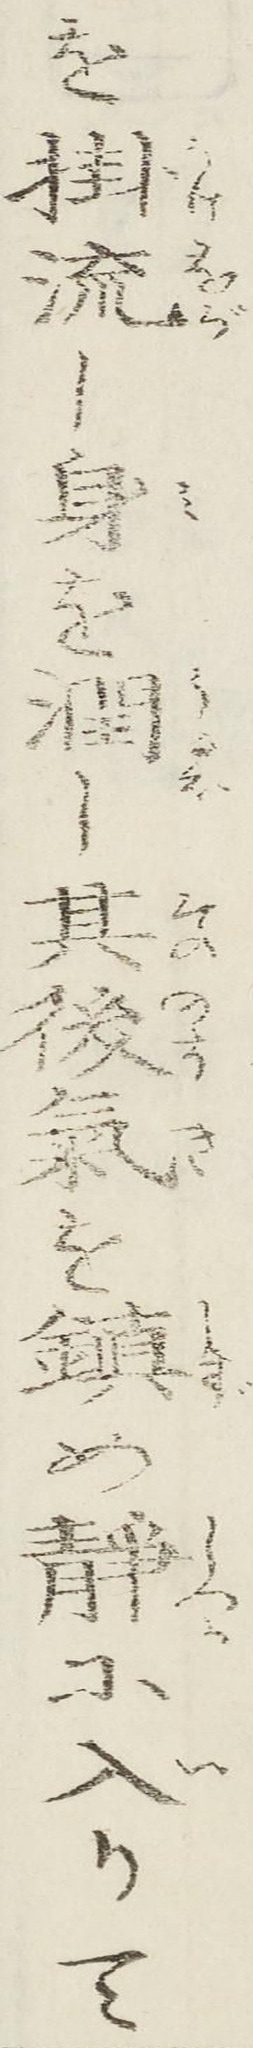を掛流し身を潤し其後気を鎮め静に入りて
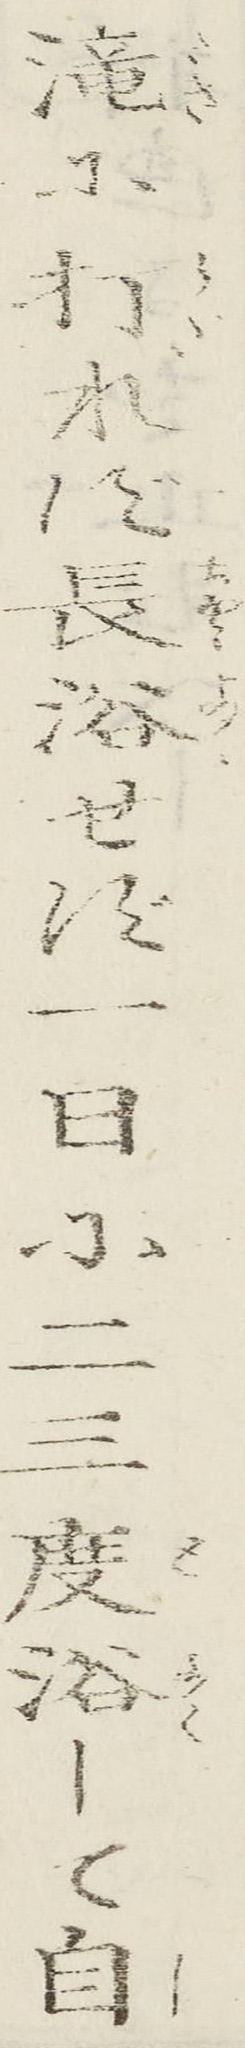滝に打れず長浴せず一日に二三度浴して自
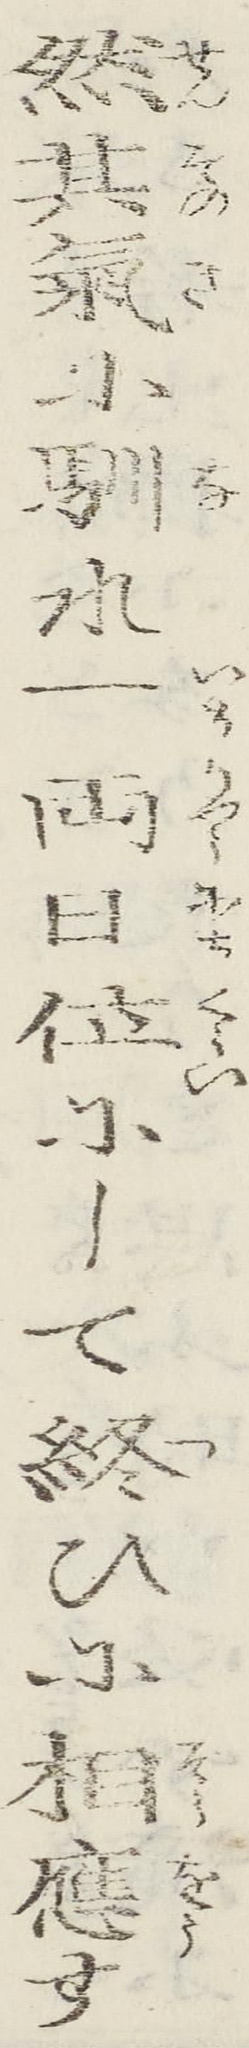然其気に馴れ一両日位にして終ひに相応す
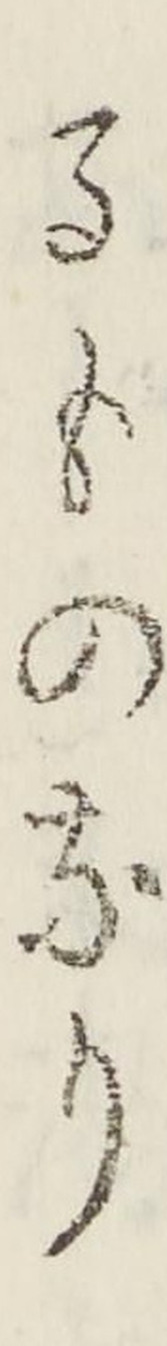るものなり
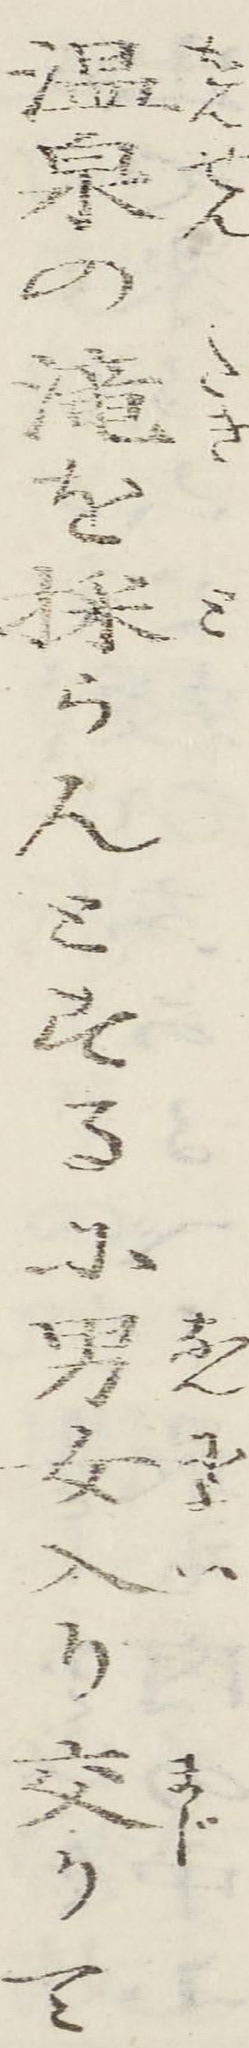温泉の滝を採らんとするに男女入り交りて
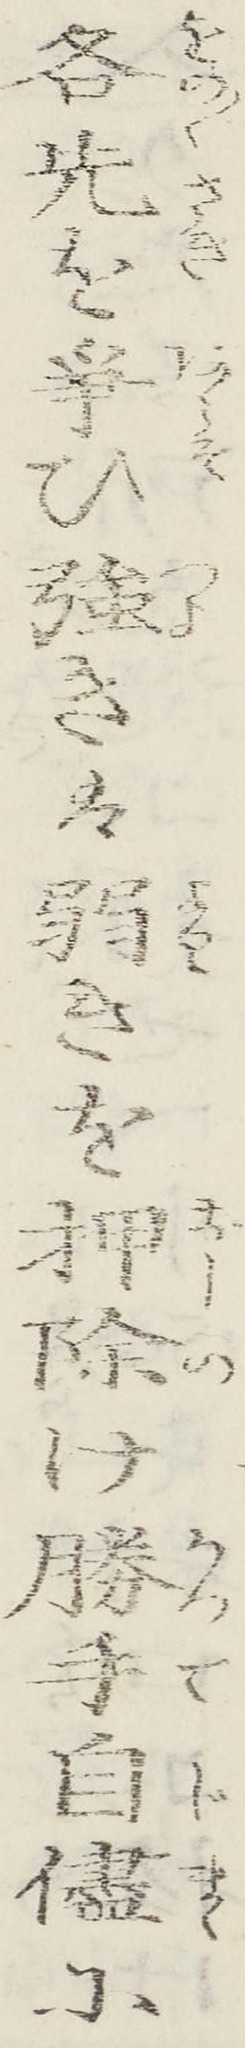各先を争ひ強きは弱きを押除け勝手自儘に
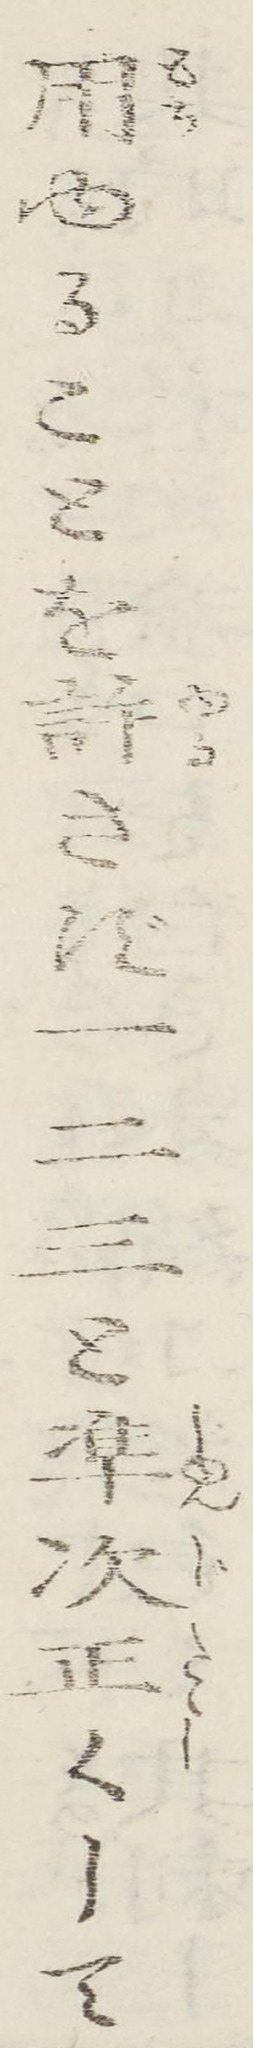用ゆることを許さず一二三と準次正くして
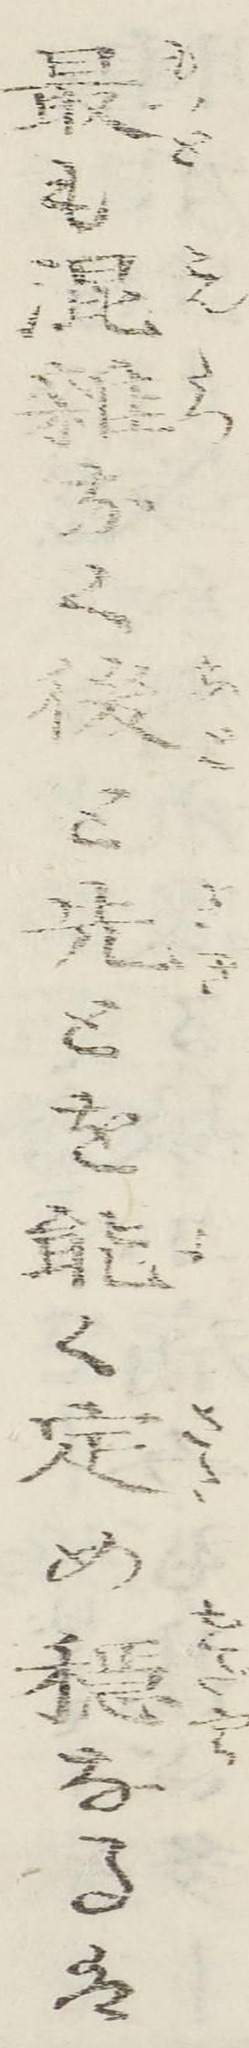最も混雑なく後と先とを能く定め穏なるは
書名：鎌先温泉由來記
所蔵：東京大学地震研究所図書室 Earthquake Research Institute Library, The University of Tokyo, JAPAN
